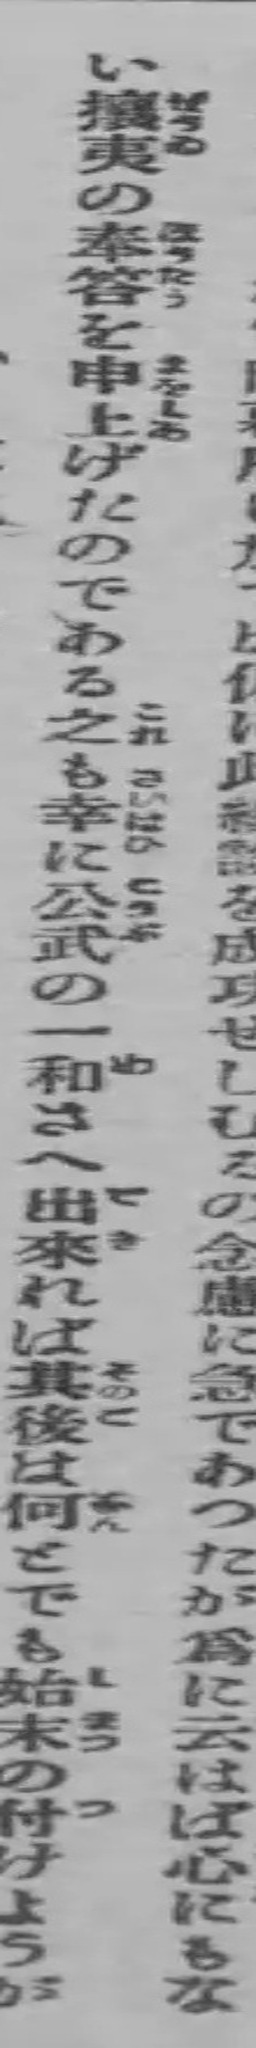い攘夷の奉答を申上げたのである之も幸に公武の一和さへ出来れば其後は何とでも始末の付けようが
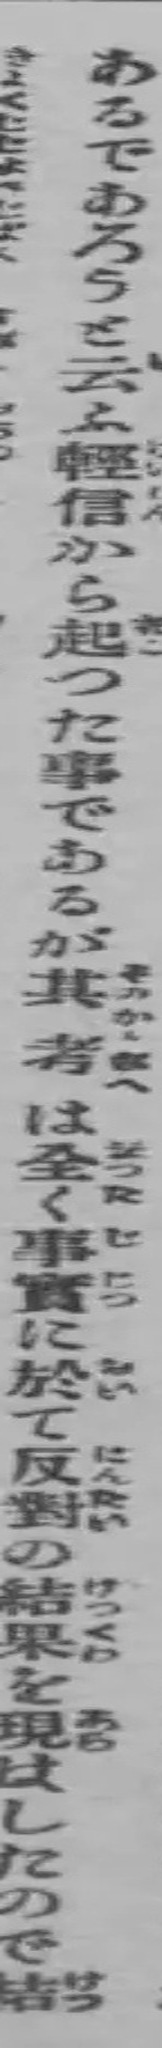あるであろうと云ふ軽信から起つた事であるが其考は全く事実に於て反対の結果を現はしたので結
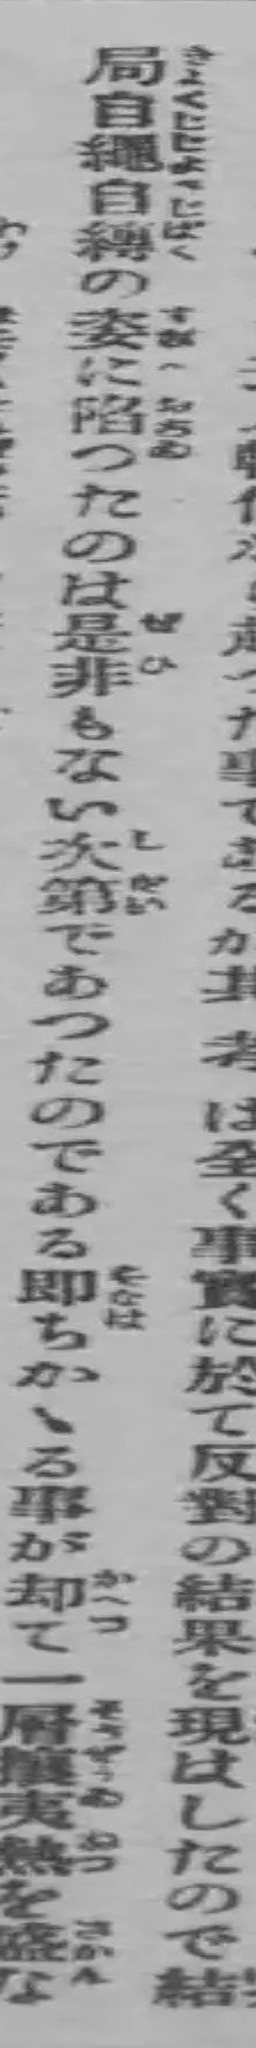局自縄自縛の姿に陥つたのは是非もない次第であつたのである即ちかゝる事が却て一層攘夷熱を盛な
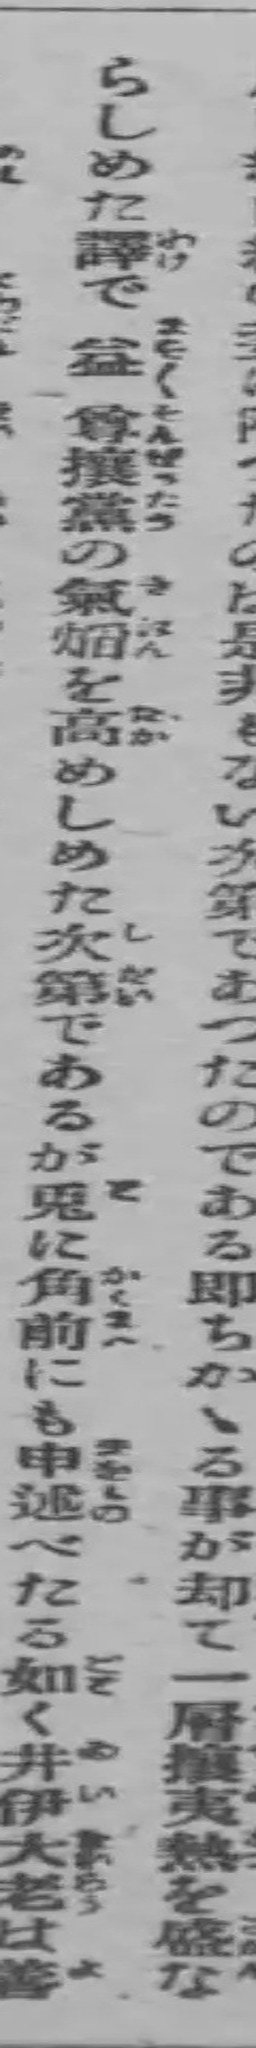らしめた訳で益尊攘党の気焔を高めしめた次第であるが兎に角前にも申述べたる如く井伊大老は善
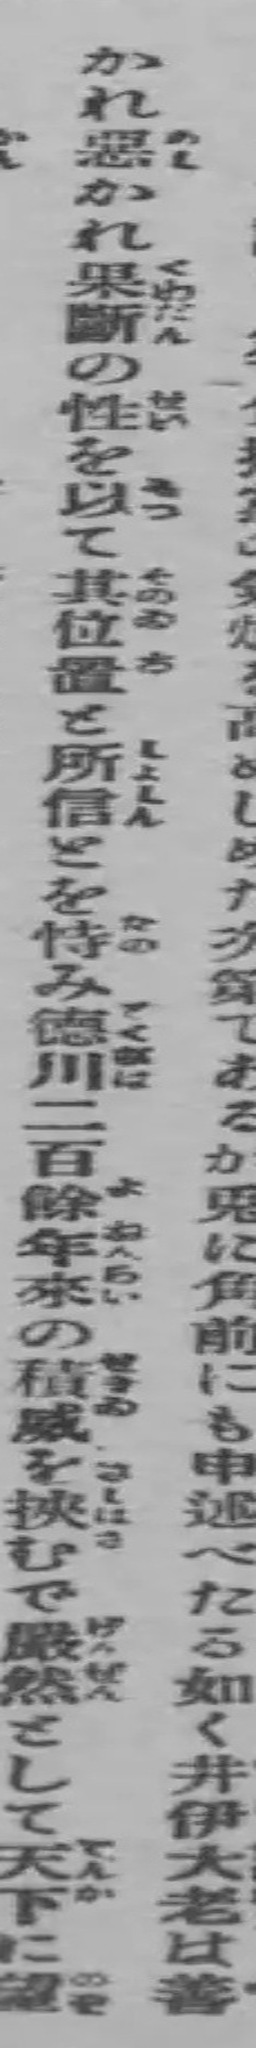かれ悪かれ果断の性を以て其位置と所信とを恃み徳川二百余年来の積威を挟むで厳然として天下に望
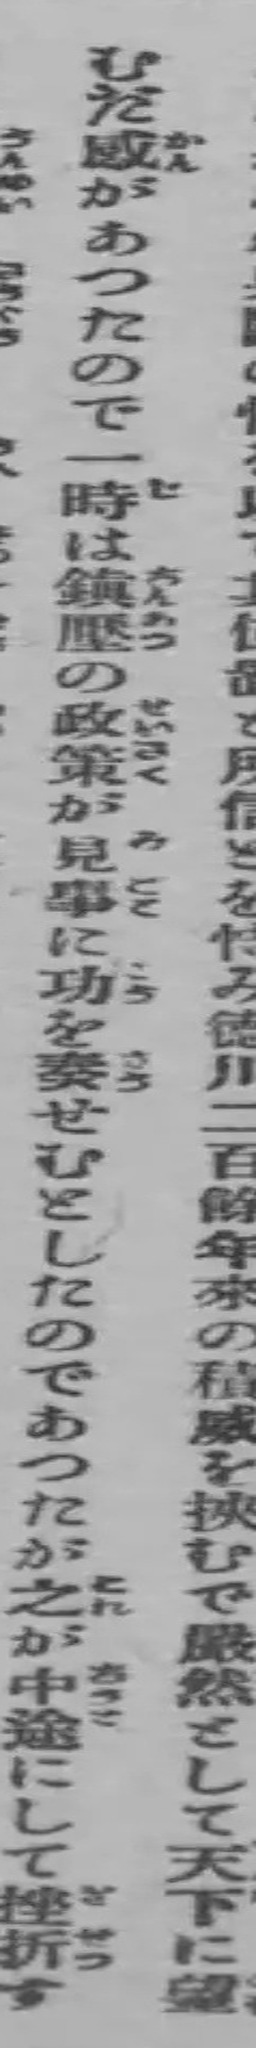むだ感があつたので一時は鎮圧の政策が見事に功を奏せむとしたのであつたが之が中途にして挫折す
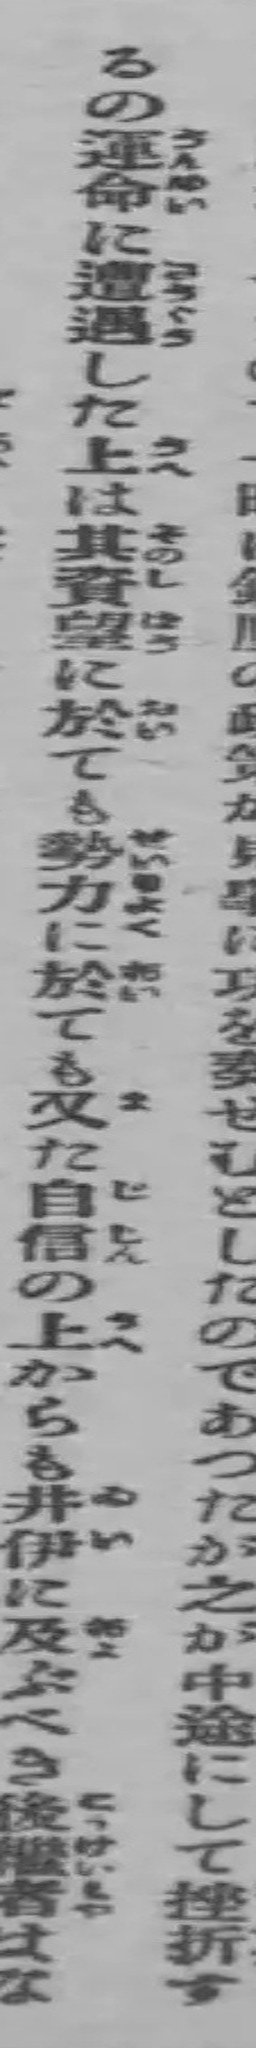るの運命に遭遇した上は其資望に於ても勢力に於ても又た自身の上からも井伊に及ぶべき後継者はな
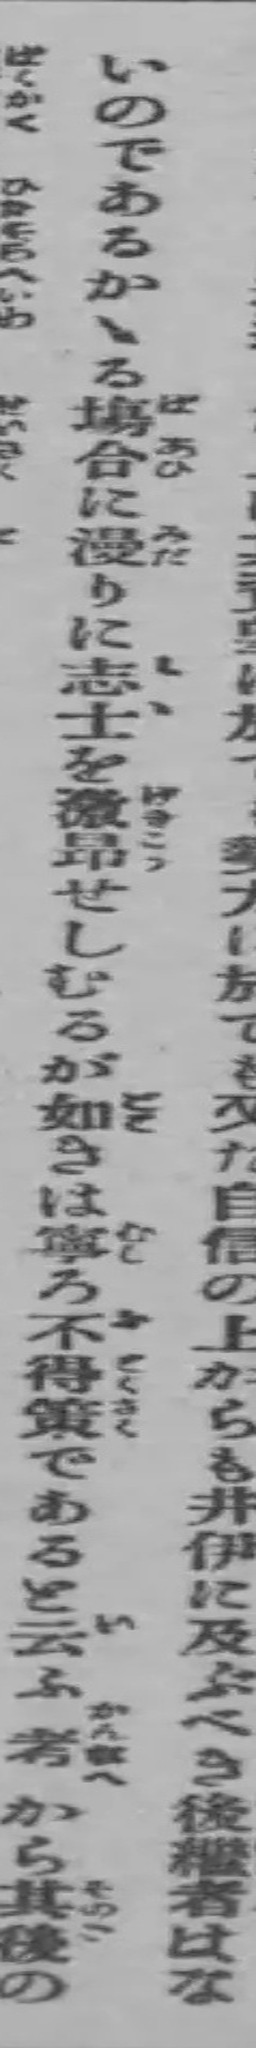いのであるかゝる場合に漫りに志士を激昂せしむるが如きは寧ろ不得策であると云ふ考から其後の
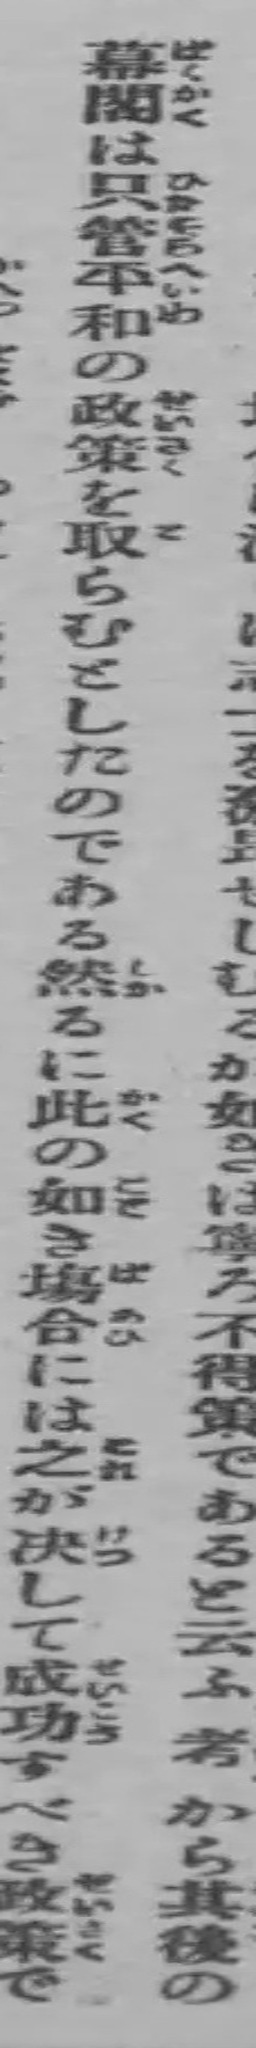幕閣は只管平和の政策を取らむとしたのである然るに此の如き場合には之が決して成功すべき政策で
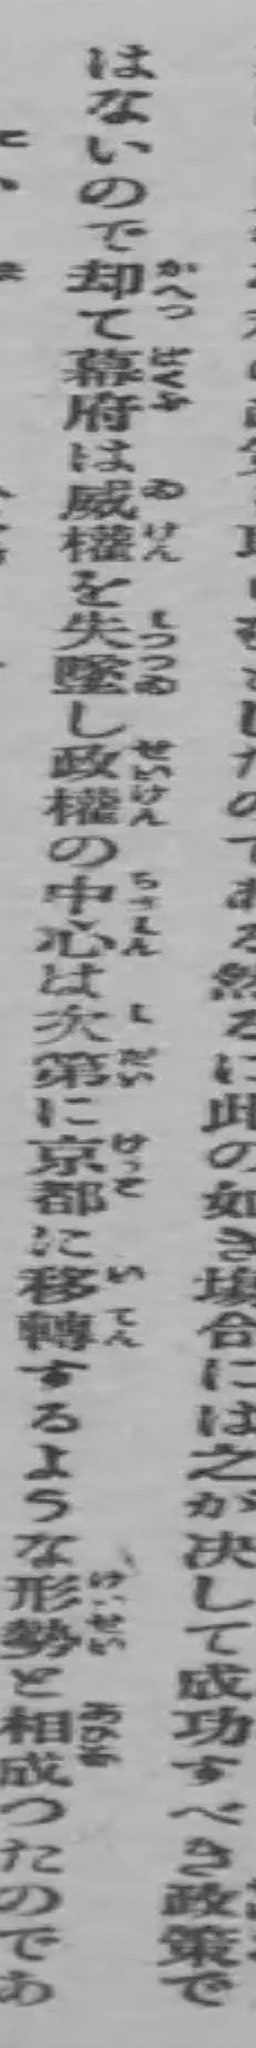はないので却て幕府は威権を失墜し政権の中心は次第に京都に移転するような形勢と相成つたのであ
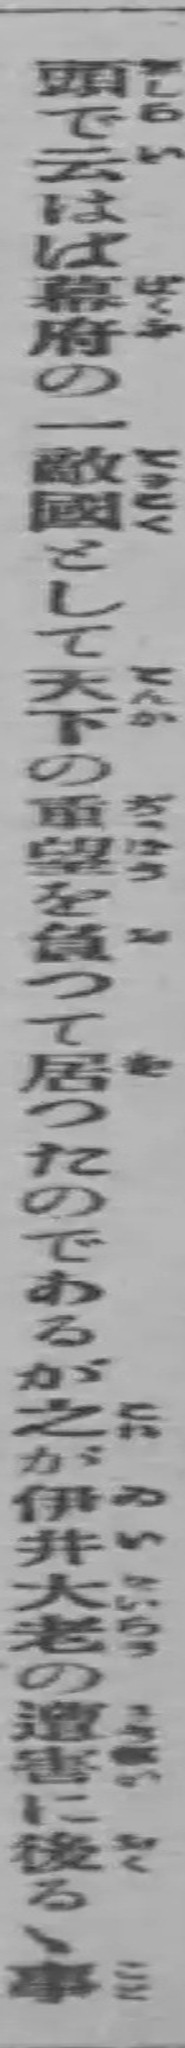頭で云はば幕府の一敵国として天下の重望を負つて居つたのであるが之が井伊大老の遭害に後るゝ事
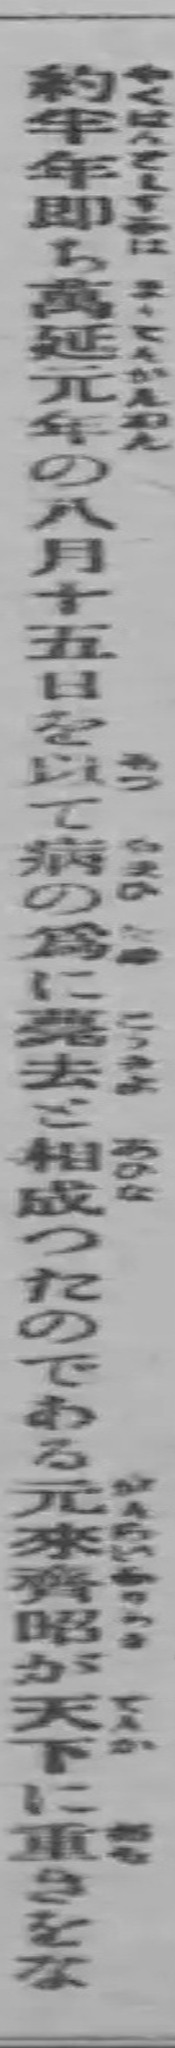約半年即ち万延元年の八月十五日を以て病の為に薨去と相成つたのである元来斉昭が天下に重きをな
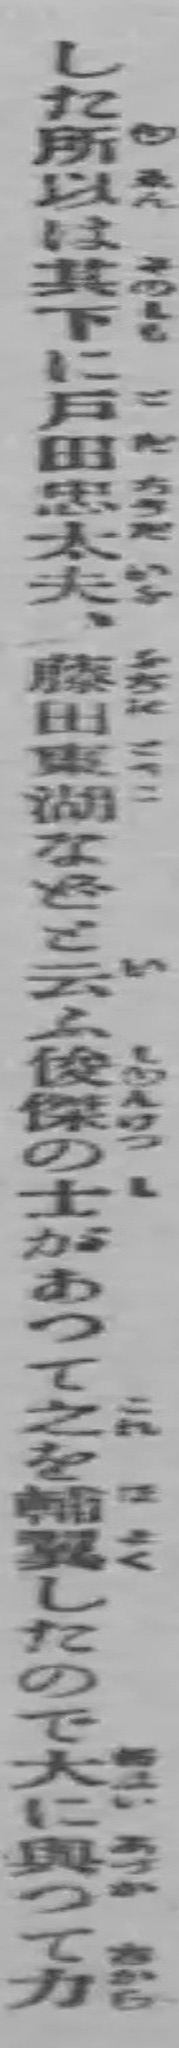した所以は其下に戸田忠太夫、藤田東湖などと云ふ俊傑の士があつて之を補翼したので大に与つて力
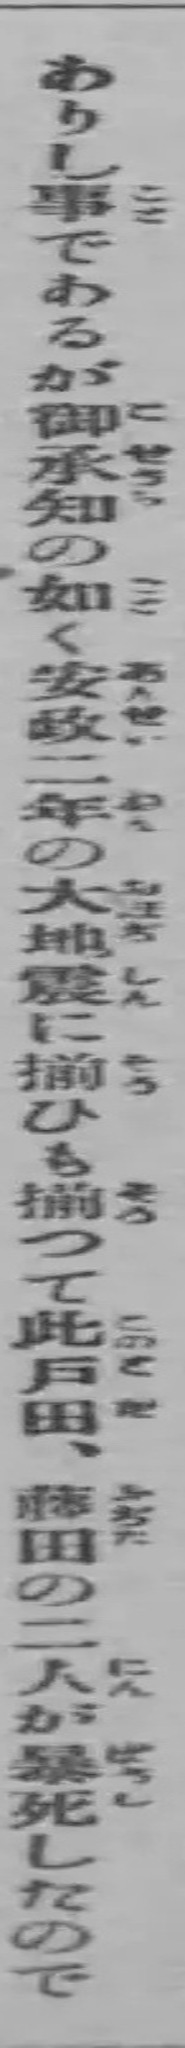ありし事であるが御承知の如く安政二年の大地震に揃ひも揃つて此戸田、藤田の二人が暴死したので
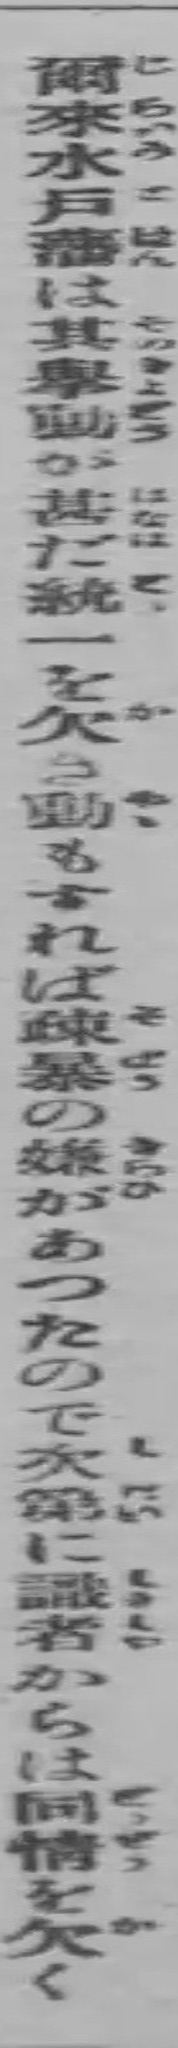爾来水戸藩は其挙動が甚だ統一を欠き動もすれば疎暴の嫌があつたので次第に識者からは同情を欠く
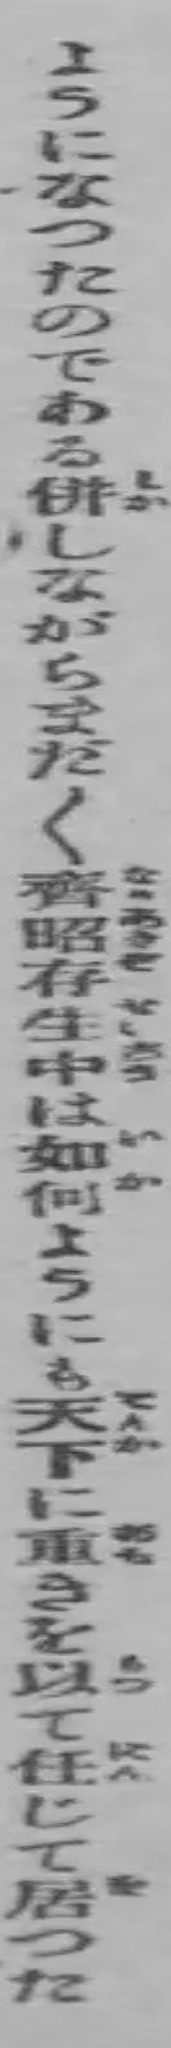ようになつたのである併しながらまだ〳〵斉昭存生中は如何ようにも天下に重きを以て任じて居つた
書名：豊橋市史談
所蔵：国立国会図書館 National Diet Library, JAPAN
